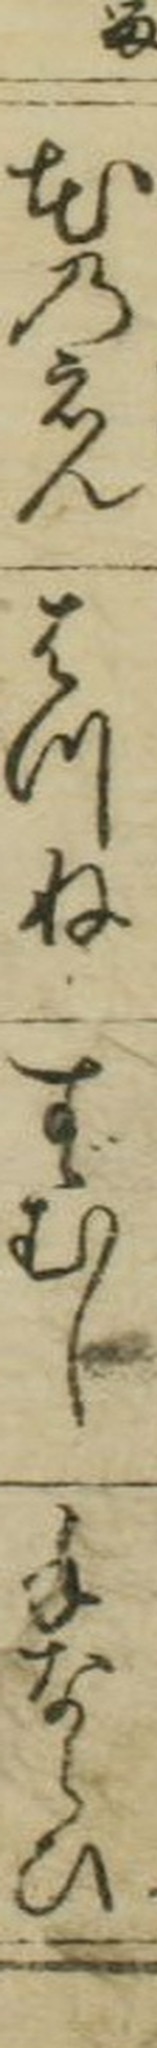花のゑんはつねすゞむし手ならひ
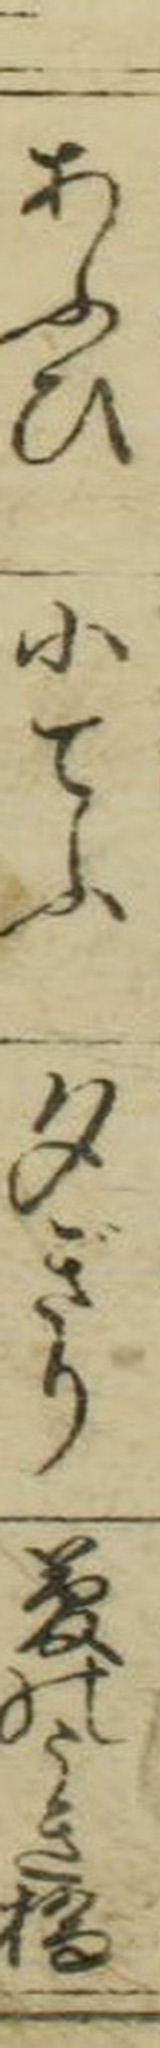あふひ小てふ夕ぎり夢のうき橋
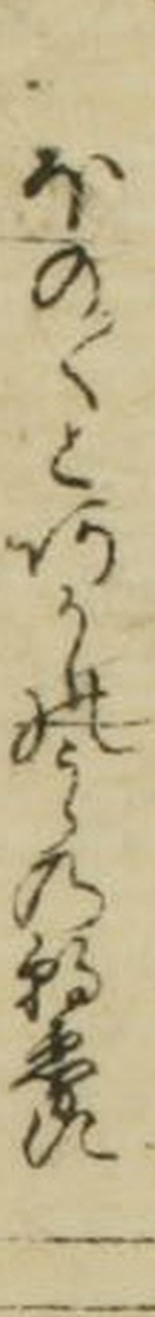ほの〳〵とあかしのうらの朝霧に
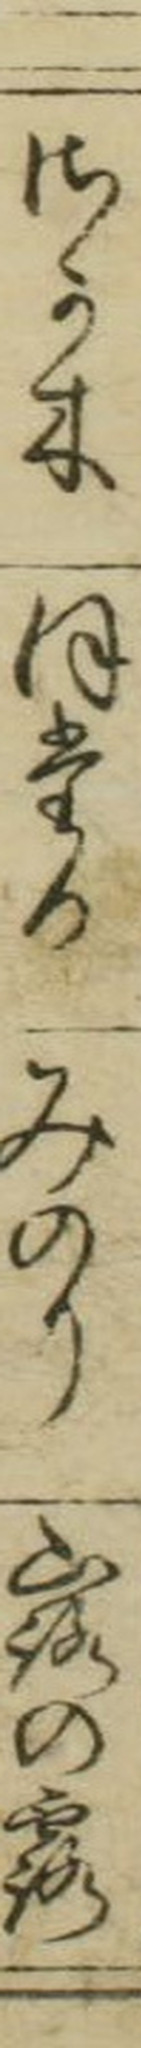さか木ほたるみのり山路の露
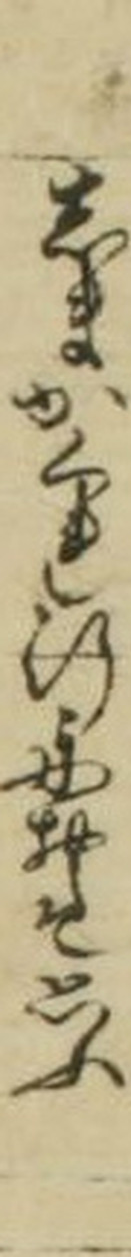しまかくれ行舟おしそ思ふ
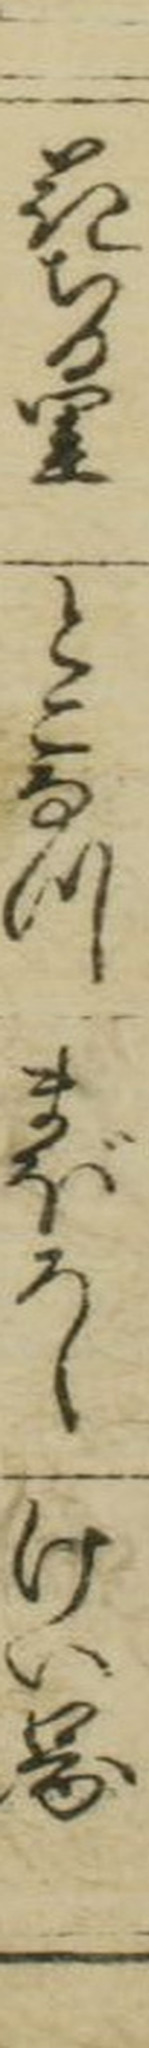花ちる里とこなつまぼろしけい図
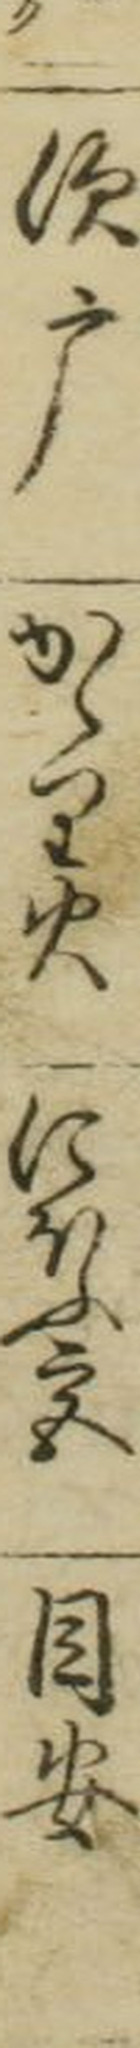須磨かゝり火にほふ宮目安
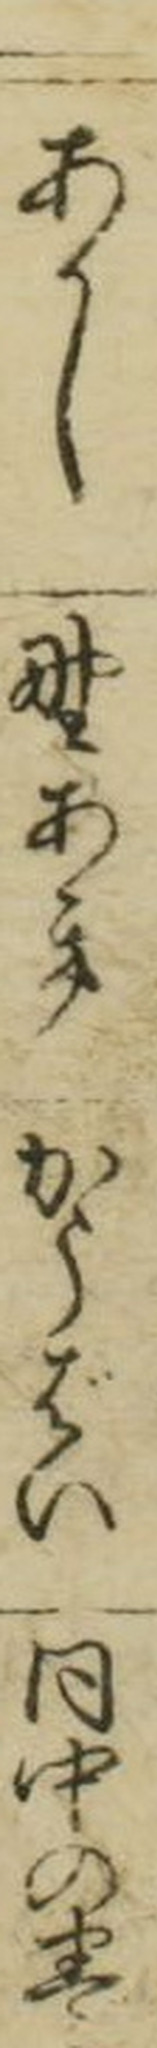あかし野あきかうばい同中の巻
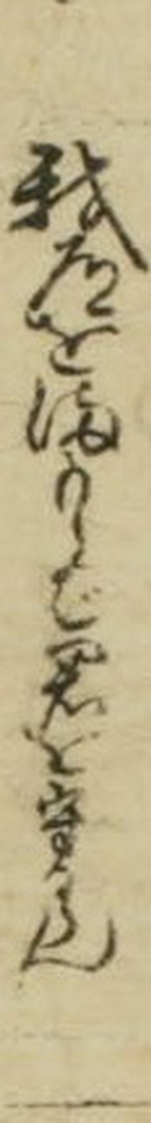千代我道をまもらば君を守るらん
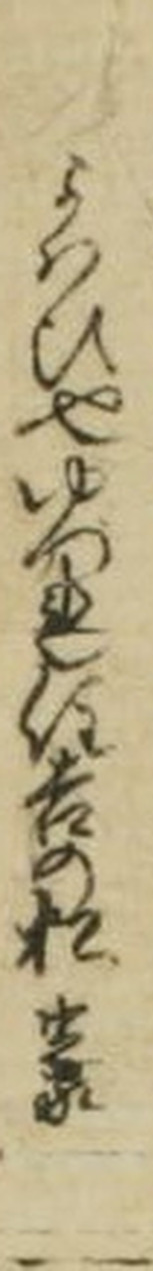よはひやゆづれ住吉の松定家
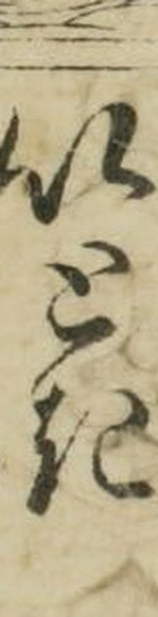いとき
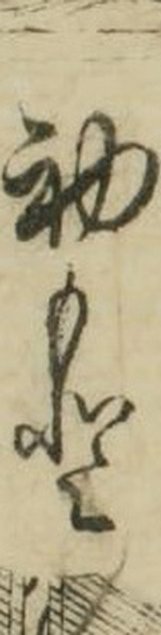初もと
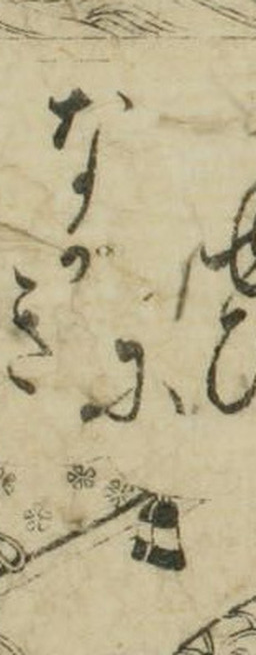ながき
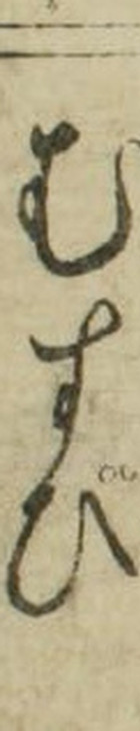むすび
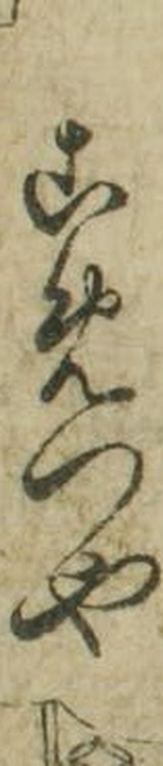こめつや

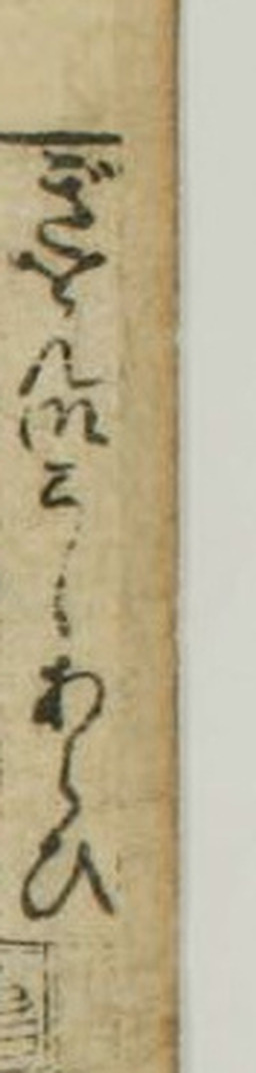ぎをん御こしあらひ
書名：女源氏教訓鑑
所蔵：東京学芸大学附属図書館
